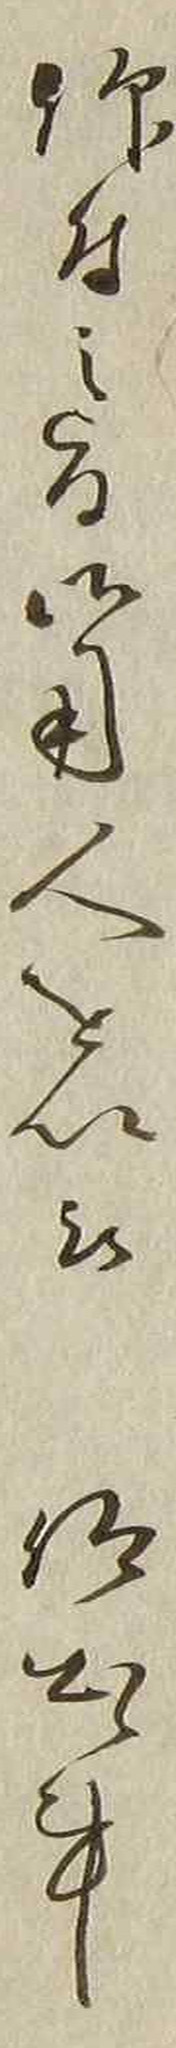仰付之旨御用人を以被仰出候事
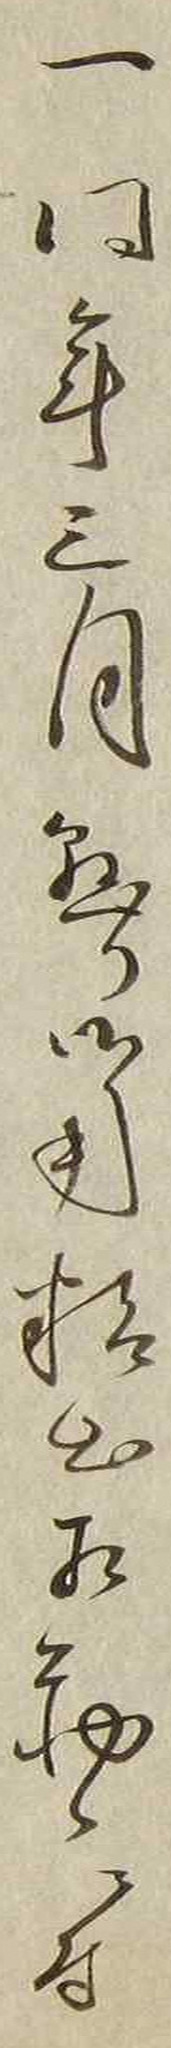一同年三月懸り御用精出相勤候ニ付
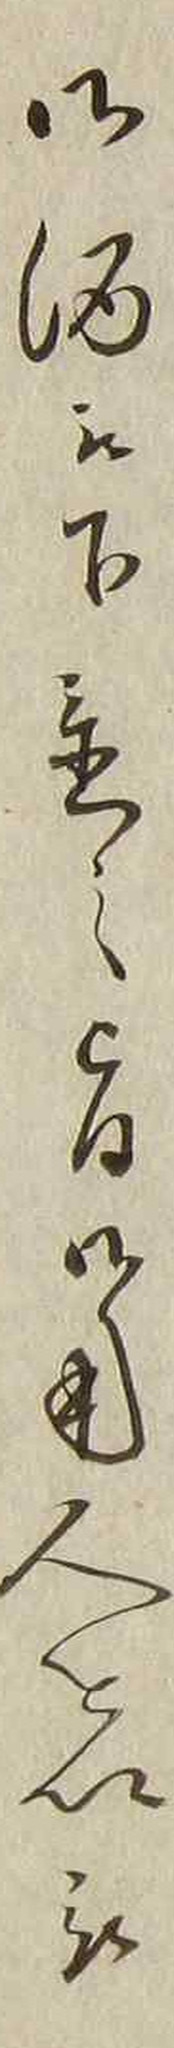御酒被下置之旨御用人を以被

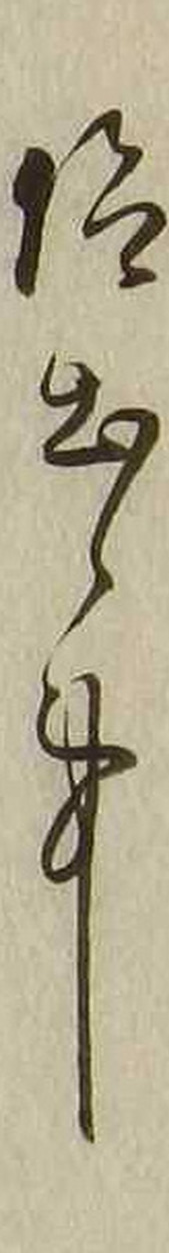仰出候事
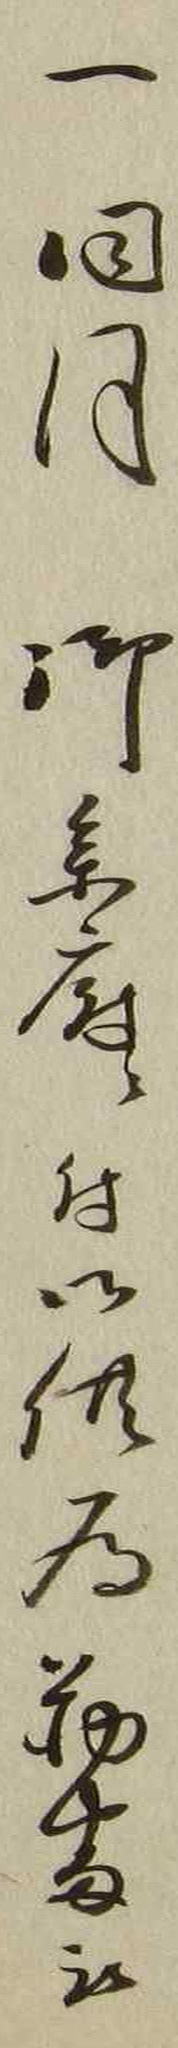一同月御参府ニ付御供為勤番被
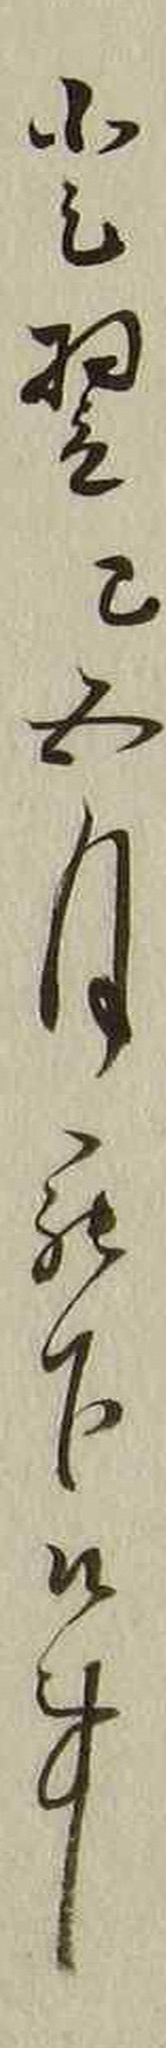登翌巳五月罷下候事
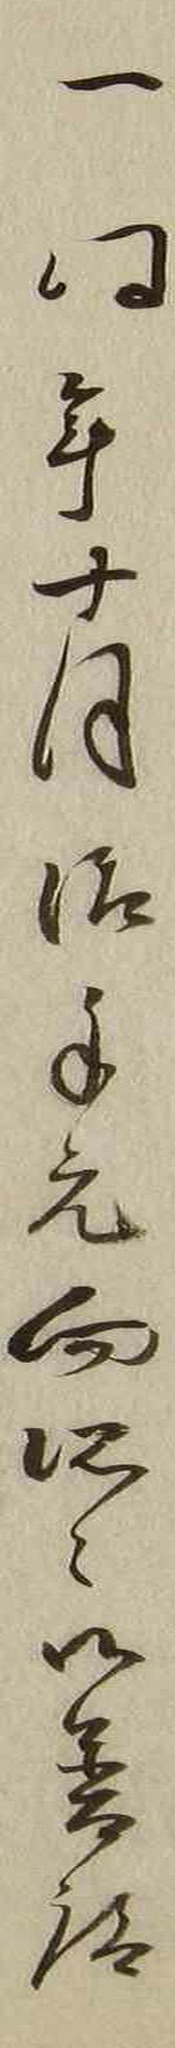一同年十月御手元向所々御普請
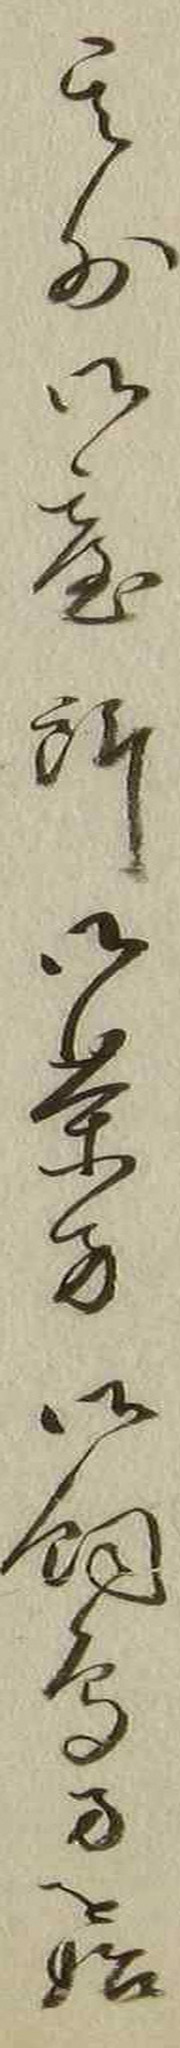其外御台所御茶方御飼鳥方を始
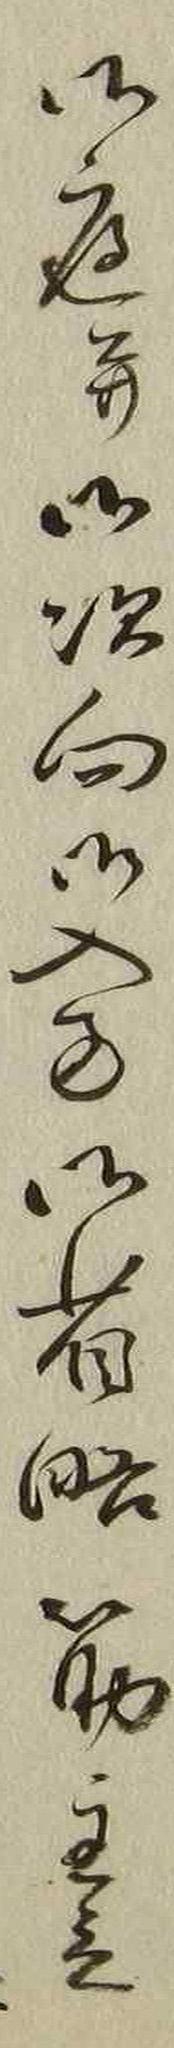御庭并御次向御入方御省略筋主立
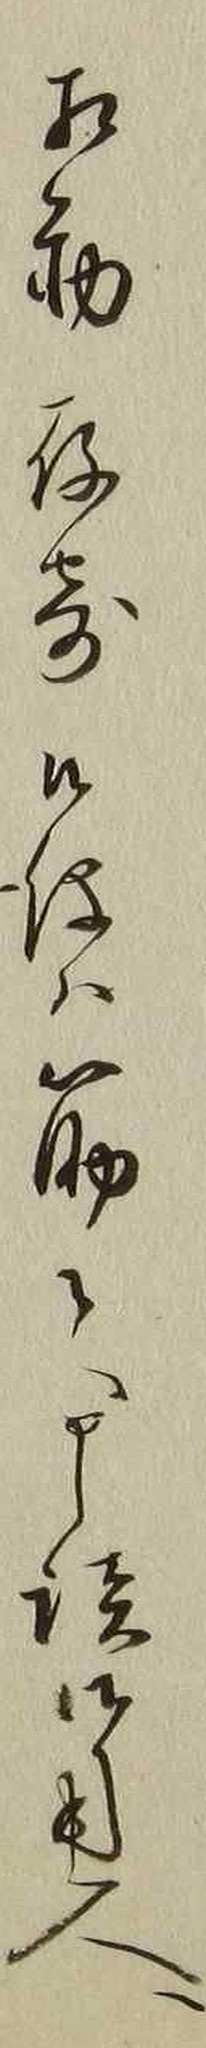相勤存寄候儀ハ筋々へ申談御用人へ
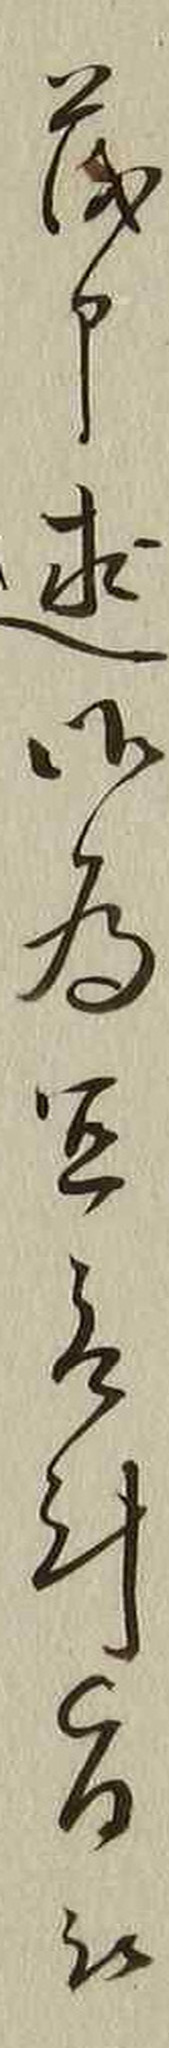茂申述御為宜取計旨被
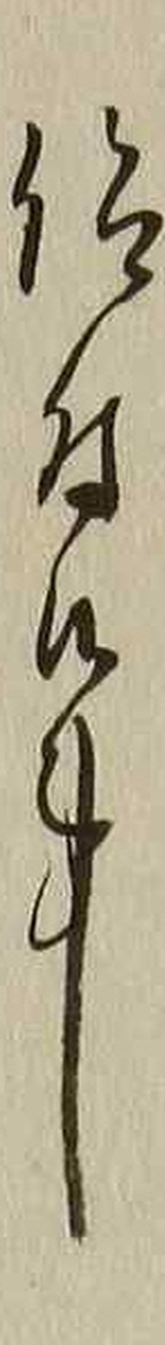仰付候事
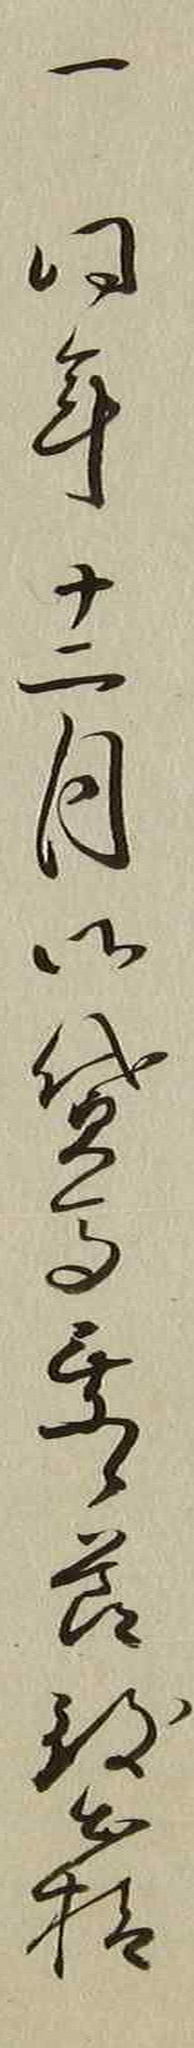一同年十二月御貸馬乗候節致出精
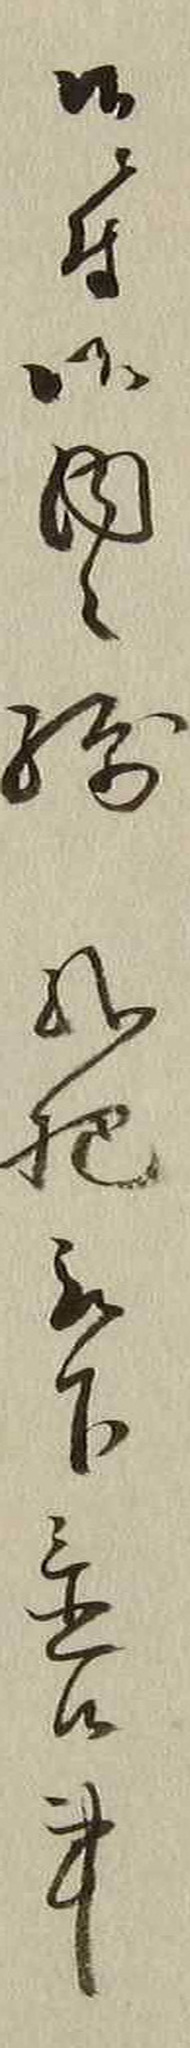候ニ付御内々綿弐把被下置候事
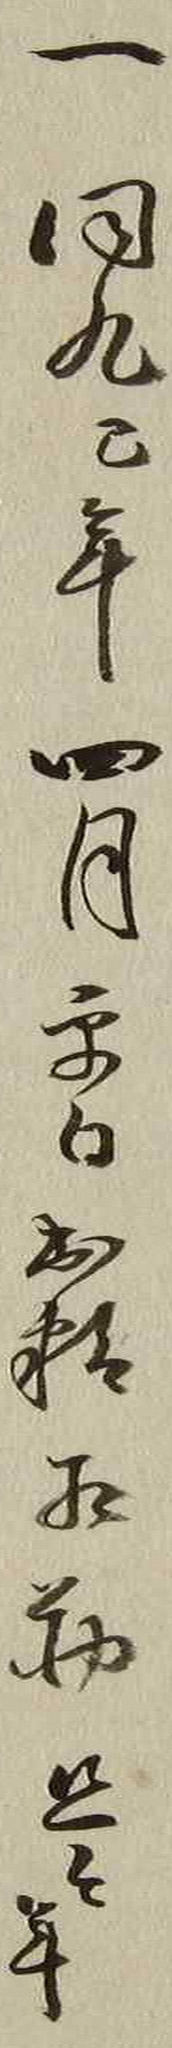一同九巳年四月平日出精相勤旦今年
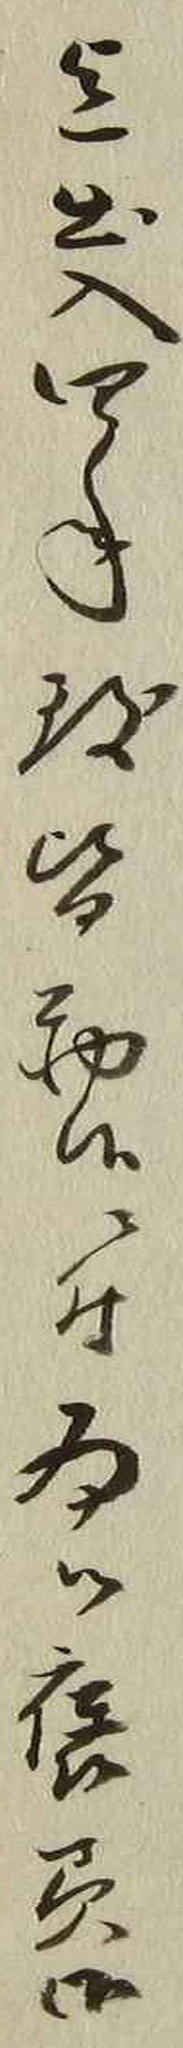迄出入四年致皆勤候ニ付為御褒美御
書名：諸士系譜　巻之25　い之部25
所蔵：会津若松市立会津図書館
